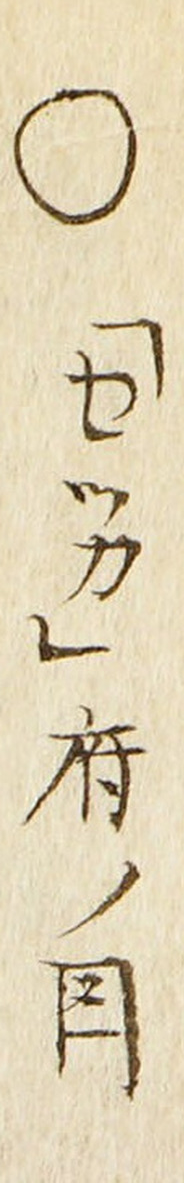〇「セツカ」府ノ図

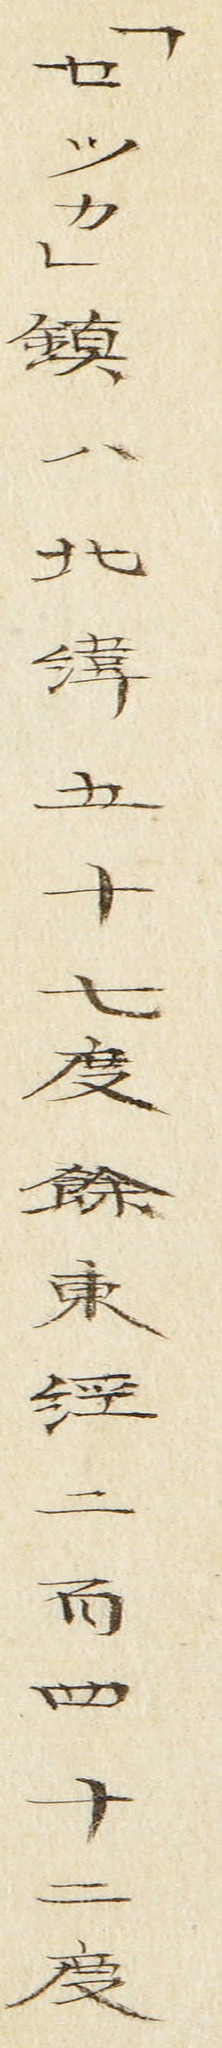「セツカ」鎮ハ北緯五十七度餘東経二百四十二度
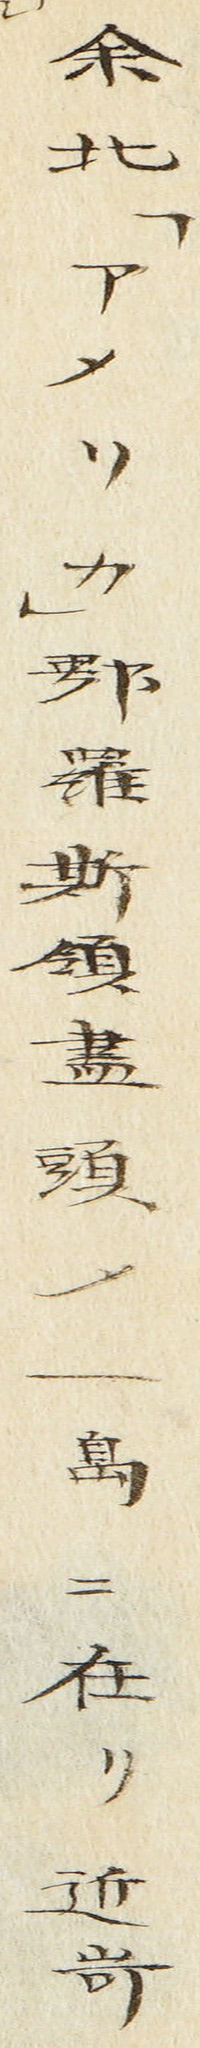余北「アメリカ」羅斯領盡頭シテ一島ニ在リ近岢
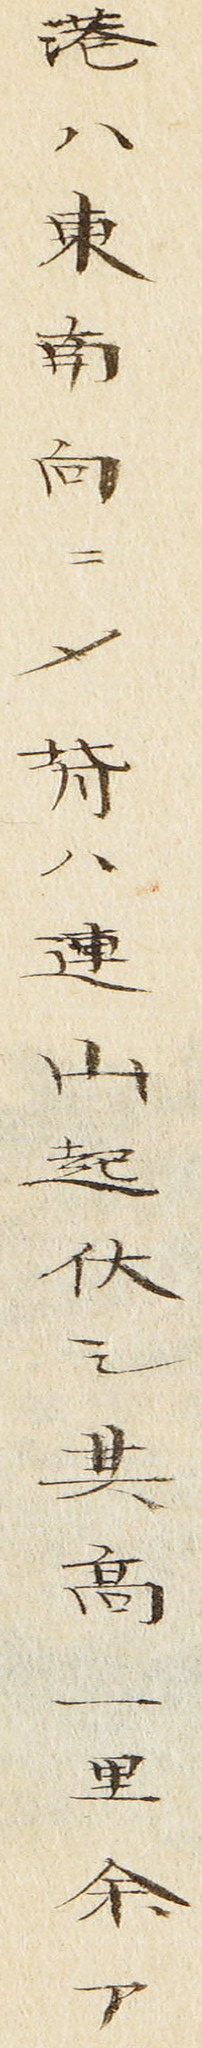港ハ東南向ニシテ背ハ連山起伏シ其高一里余ア
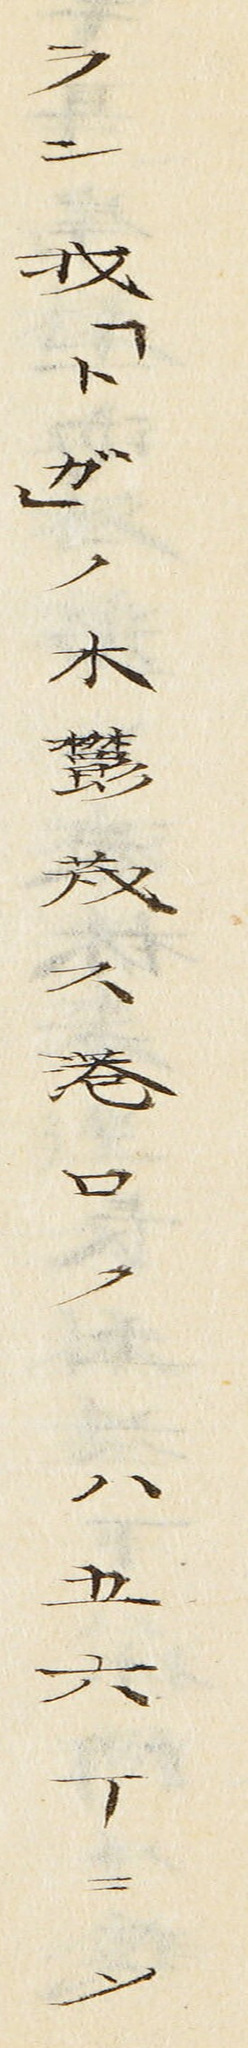ラン我「トガ」ノ木鬱茂ス港口ノハ五六丁ニシテ
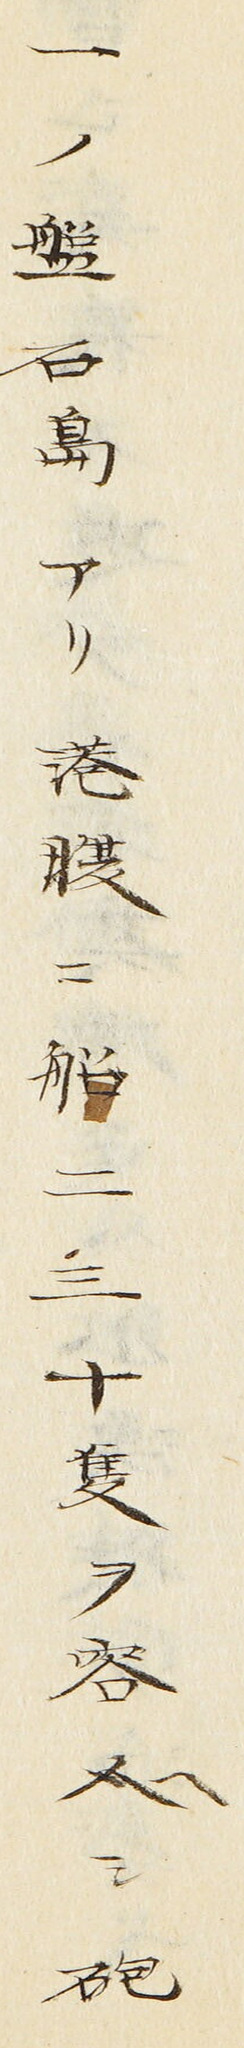一ノ磐石島アリ港腹ニ船二三十隻ヲ容ヘシ砲
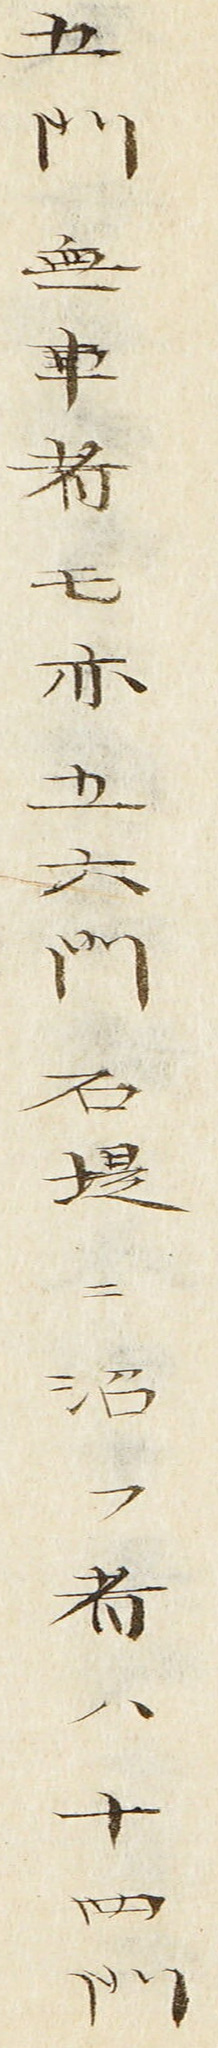五門無車者モ亦五六門石堤ニ沿フ者ハ十四門
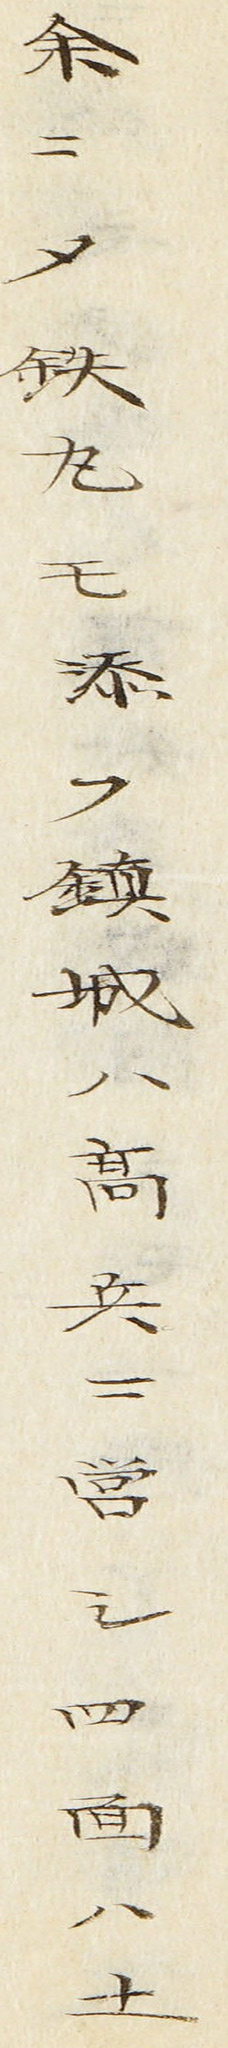余ニシテ鉄丸モ添フ鎮城ハ高兵ニ営シ四面ハ土
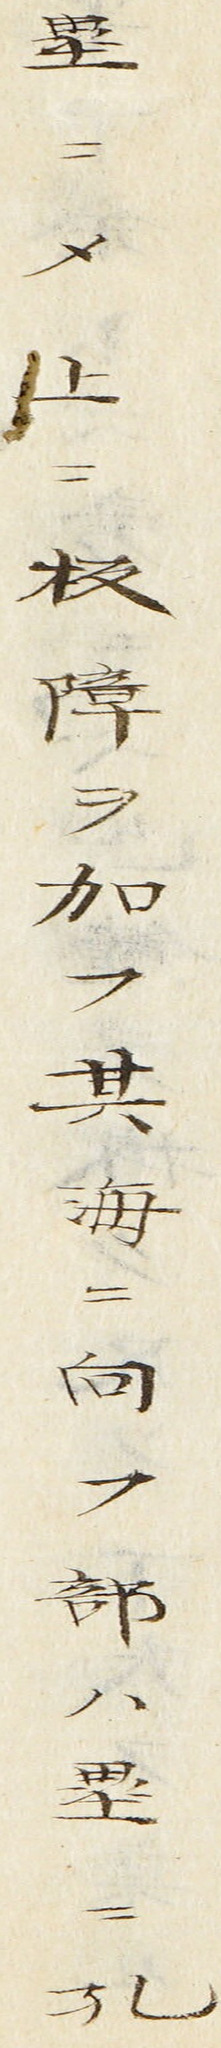塁ニシテ上二板障ヲ加フ其海ニ向フ部ハ塁ニ孔
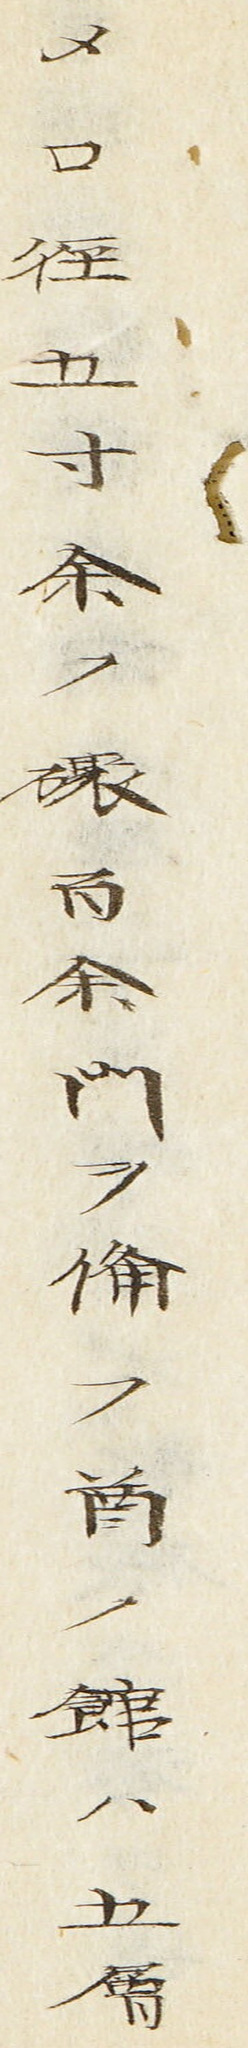シテ径五寸余ノ百余門ヲ備フ酋ノ館ハ五層
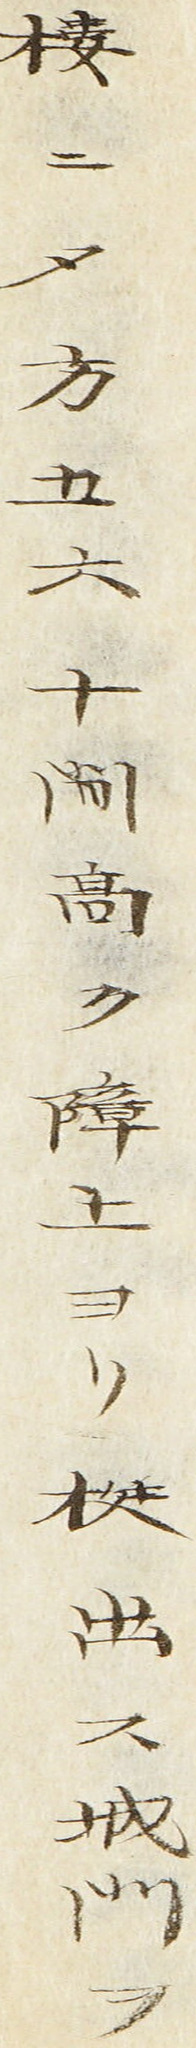楼ニシテ方五六十間高ク障上ヨリ出ス城門ヲ
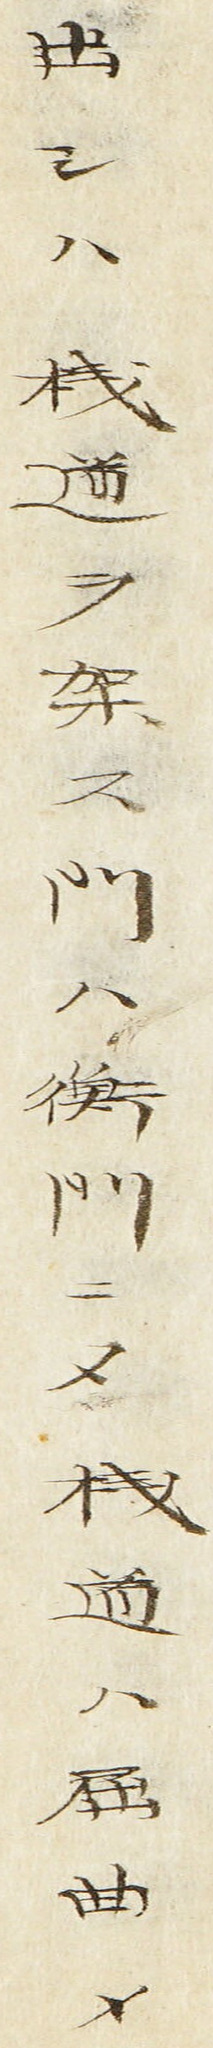出シハ桟道ヲ架ス門ハ衡門ニシテ桟道ハ屈曲シテ

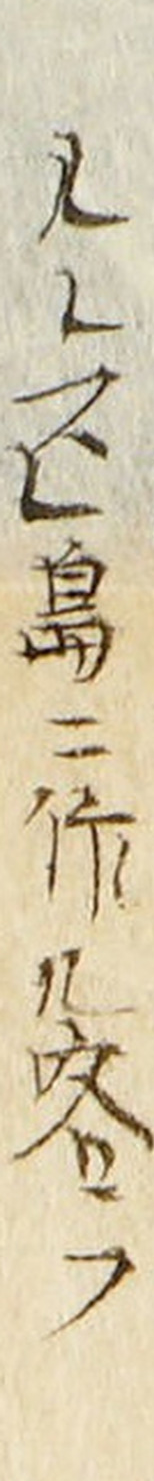ルレス」島ニ作ル客フ
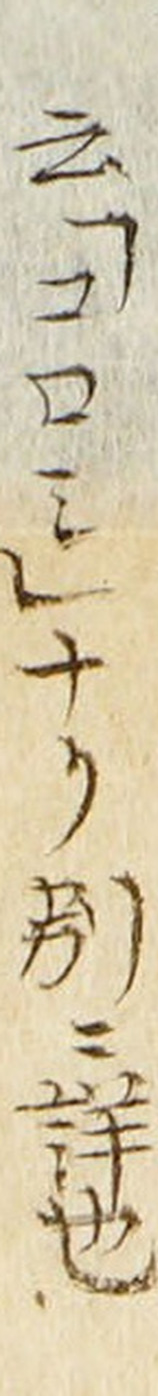云「コロシ」ナリ別ニ詳也
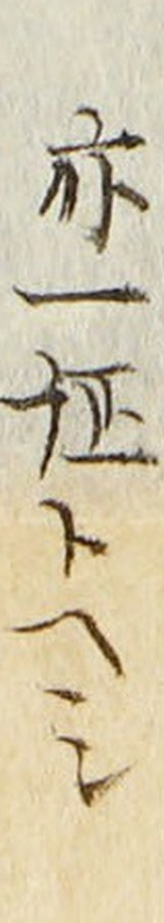亦一証トヘシ

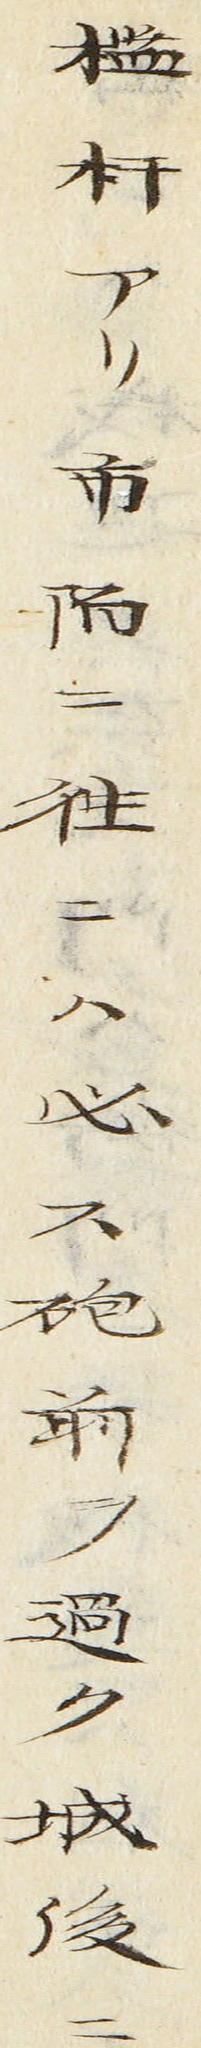檻杆アリ市陌ニ往ニハ必ス砲前ヲ過ク城後ニ
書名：蕃談
